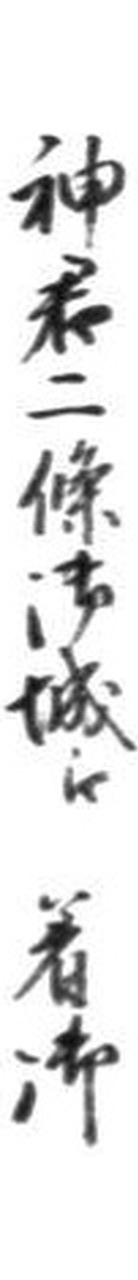神君二條御城江着御
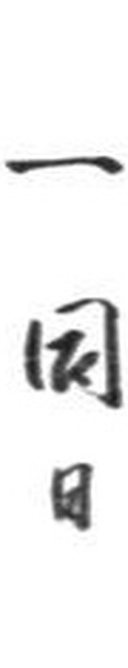一同日
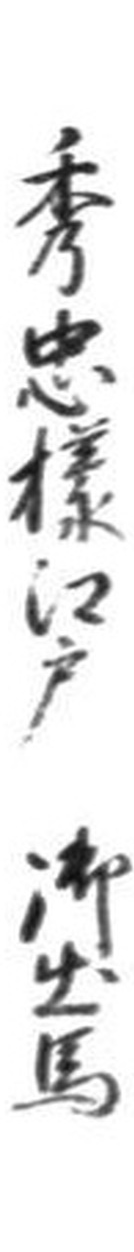秀忠様江戸御出馬
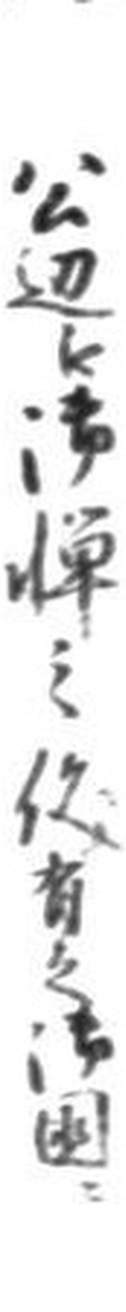寛儀公辺江御憚之儀有之御国ニ
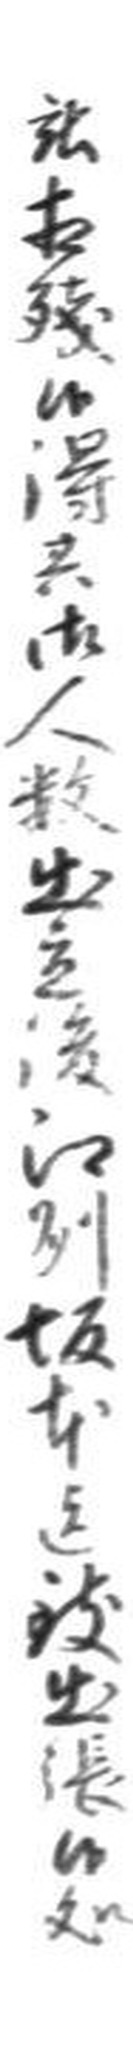被相残候得共御人数出立後江州坂本迄致出張候処
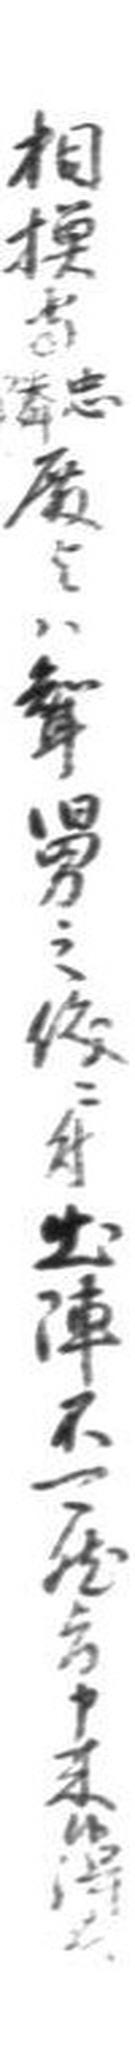隣殿与ハ聟舅之儀ニ付出陣不可然旨申来候得共
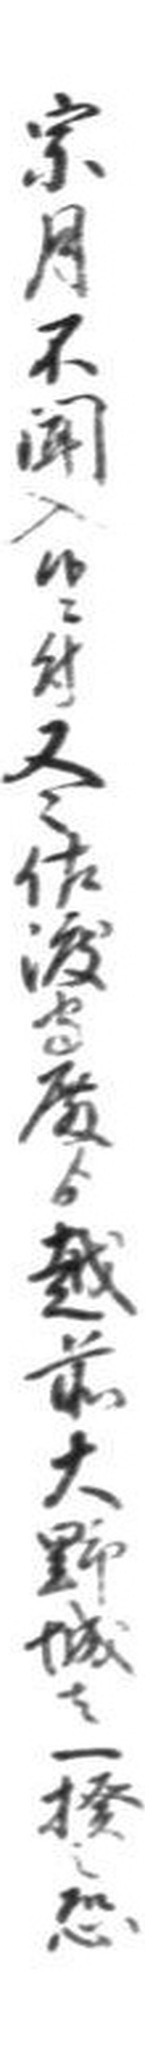宗月不聞入候ニ付又々佐渡守殿ゟ越前大野城者一揆之恐

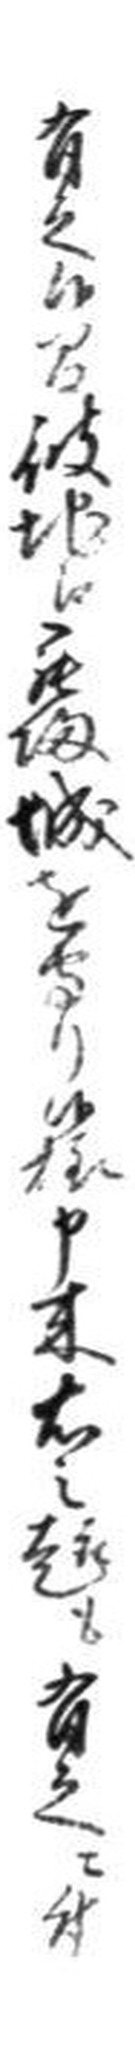有之候間彼地江罷帰城を守り候様申来右之趣も有之ニ付
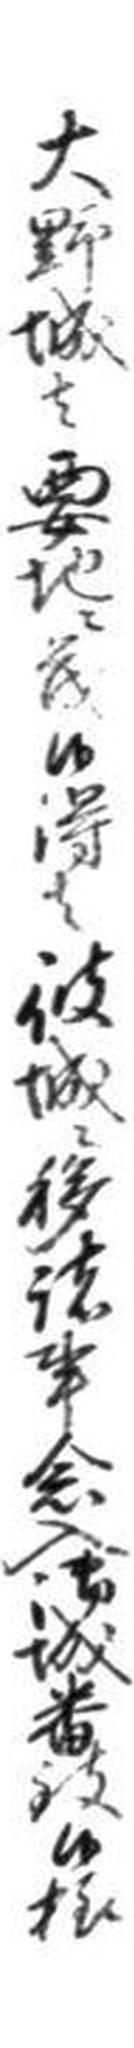大野城者要地ニ茂候得者彼城ニ移諸事念入御城番致候様
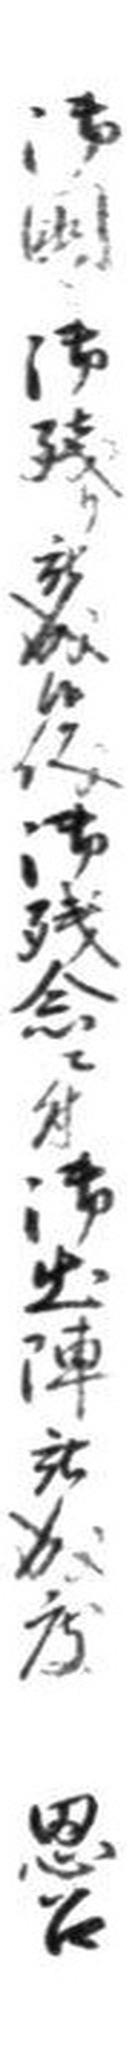御国ニ御残り被成候儀御残念ニ付御出陣被成度思召
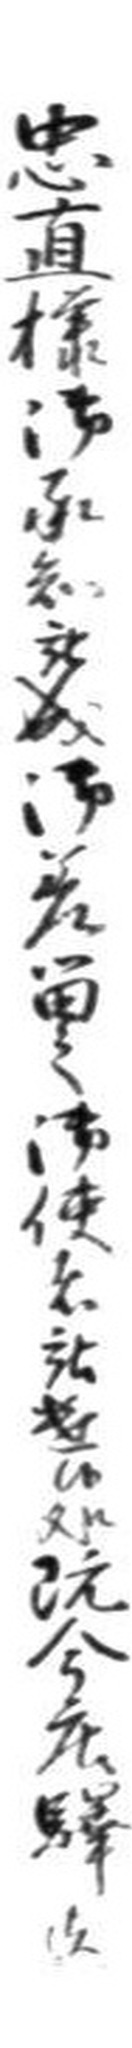忠直様御承知被成御差留之御使者被遣候処既今庄駅迄
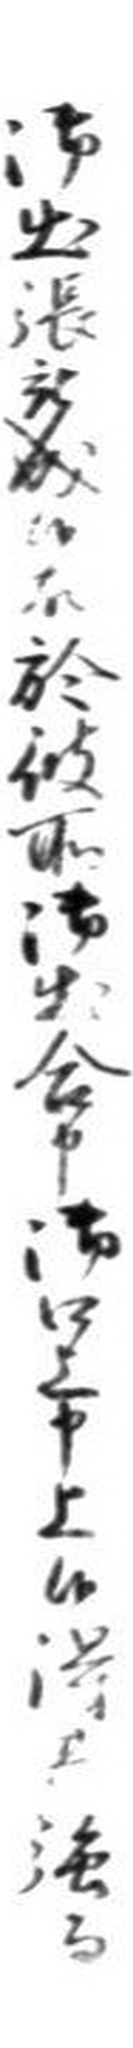御出張被成候故於彼所於出合申御口上申上候得共強而
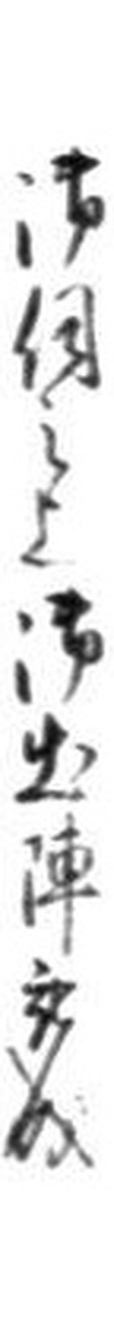御伺之上御出陣被成
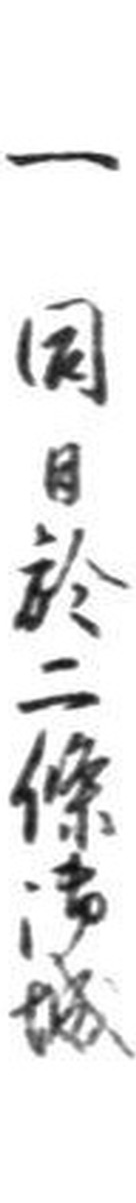一同日於二條御城
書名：家譜 二 忠直公 従文禄四年到慶安四年
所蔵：福井県文書館 Fukui Prefectural Archives
